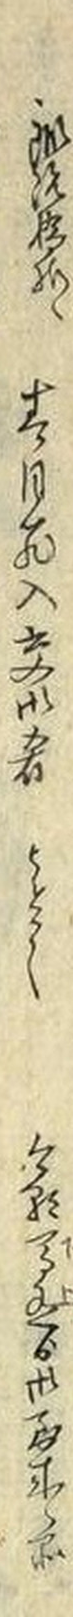鍛冶橋様へ青目籠入交御肴被進之今朝馬有ゟ御到来候品
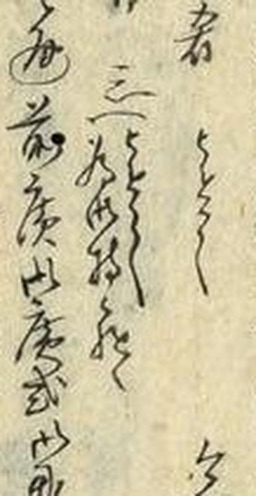節御祝被遊候
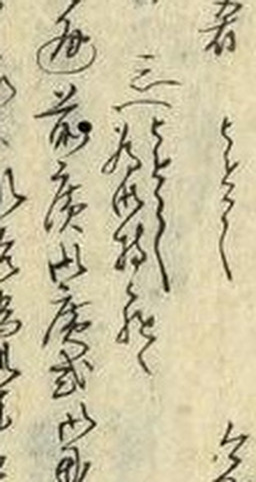節御祝被遊候
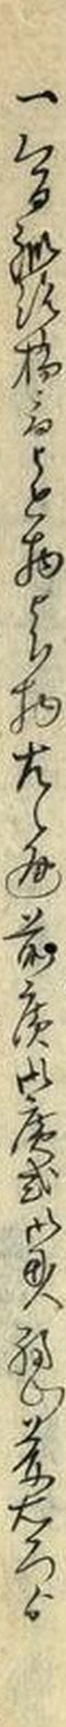一今日鍛冶橋ニ而被進物被下物左之通前広御広式御用人福山藤右衛門ゟ
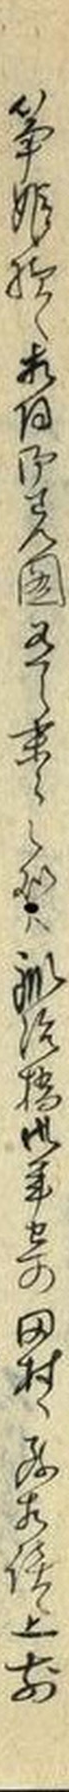箏姫様へ相伺御指図有之末々之処ハ鍛冶橋御年寄田村へ致相談候上前
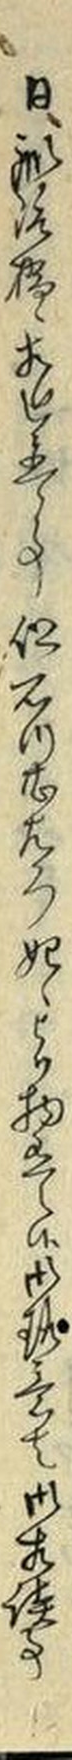日鍛冶橋へ相廻置候事但石川甚左衛門始被下物有之候御趣意は御相談事
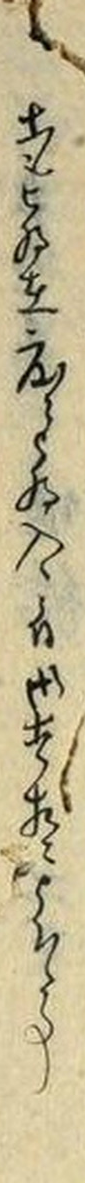等も被為在度々被為入候ニ付御愛相ニ被下候事

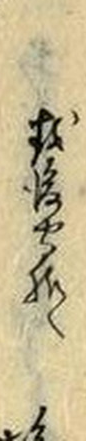越後守様へ
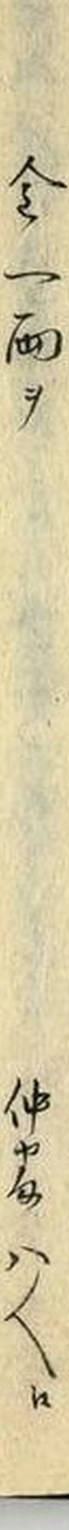金一両ヲ仲番八人江
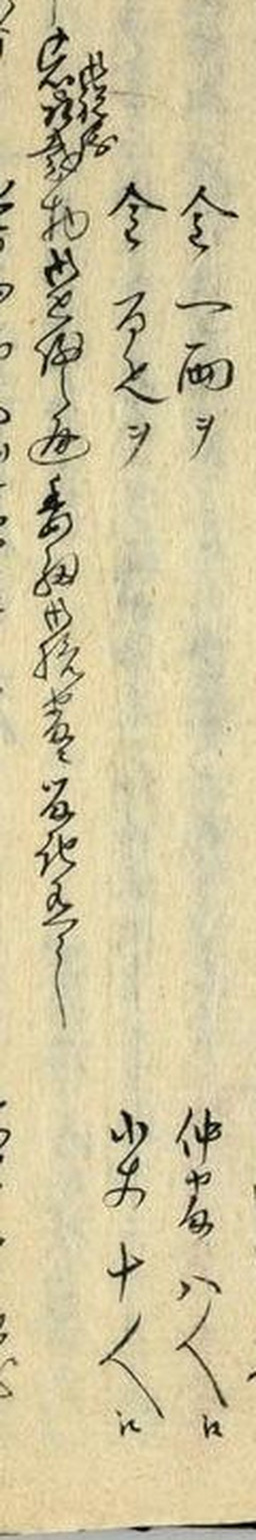金百疋ヲ小使十人江
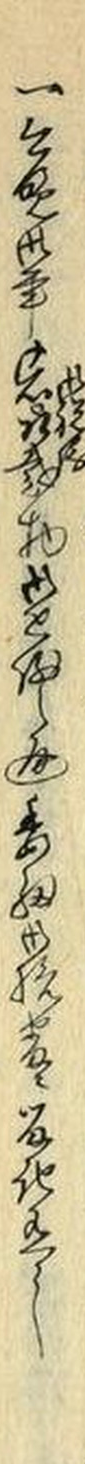一今晩御年忘御祝儀頂戴物御近例之通委細御膳番ニ留記有之
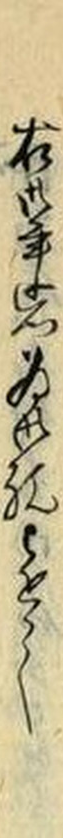右御年忘為御祝被進之
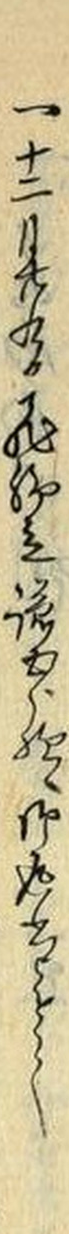一十二月廿九日飛脚立謙五郎様へ御返書被進之
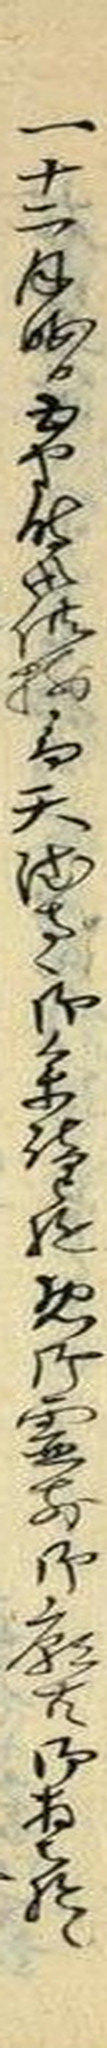一十二月晦日五半時御供揃ニ而天徳寺へ御参詣被遊惣御霊前御廟共御拝被遊候
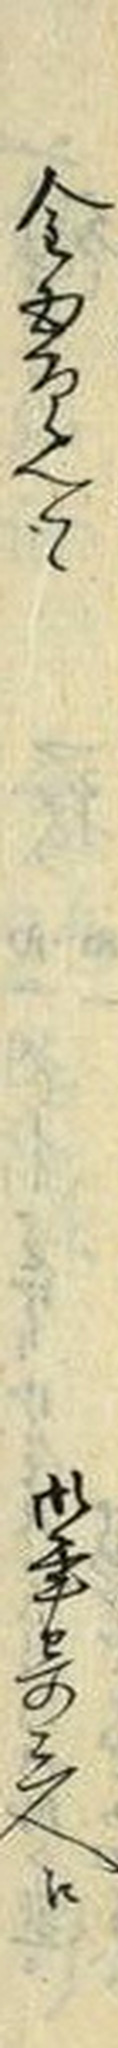金五百疋ツゝ御年寄三人江
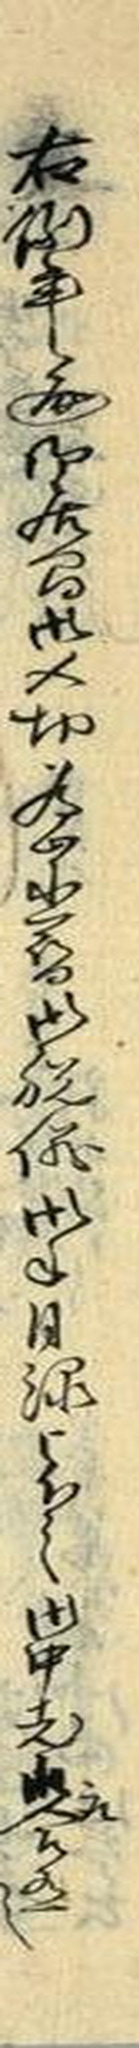右例年之通御居間御〆切為歳暮御祝儀御手目録被下之御中老御取合有之
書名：少傅日録抄（斉承付側向頭取日記、在府）
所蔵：福井県文書館 Fukui Prefectural Archives
